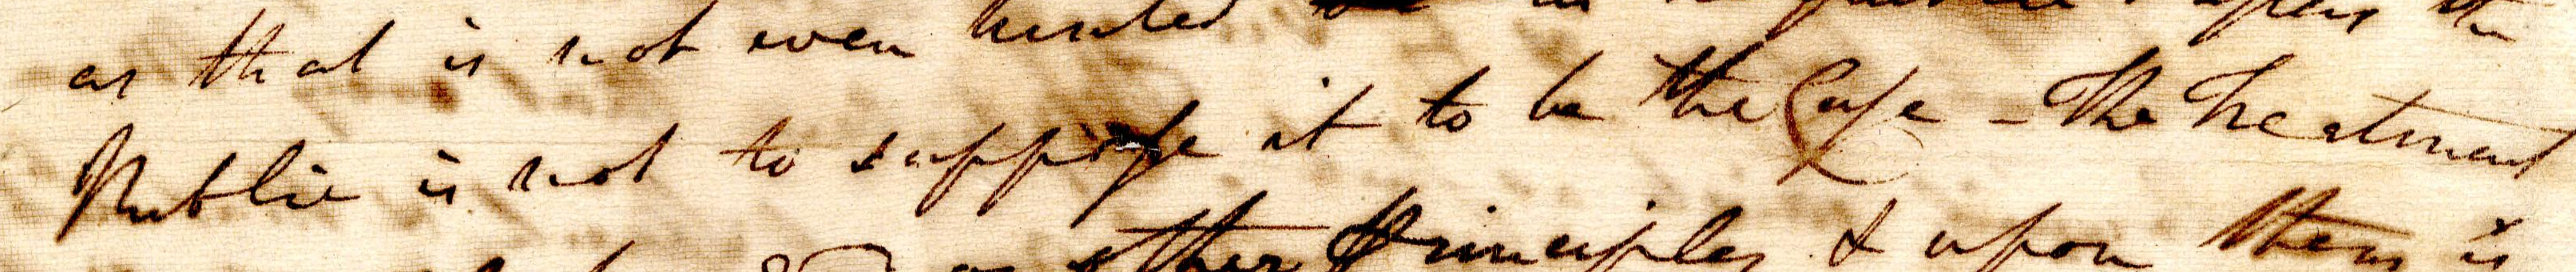Public is not to suppose it to be the Case- The treatment
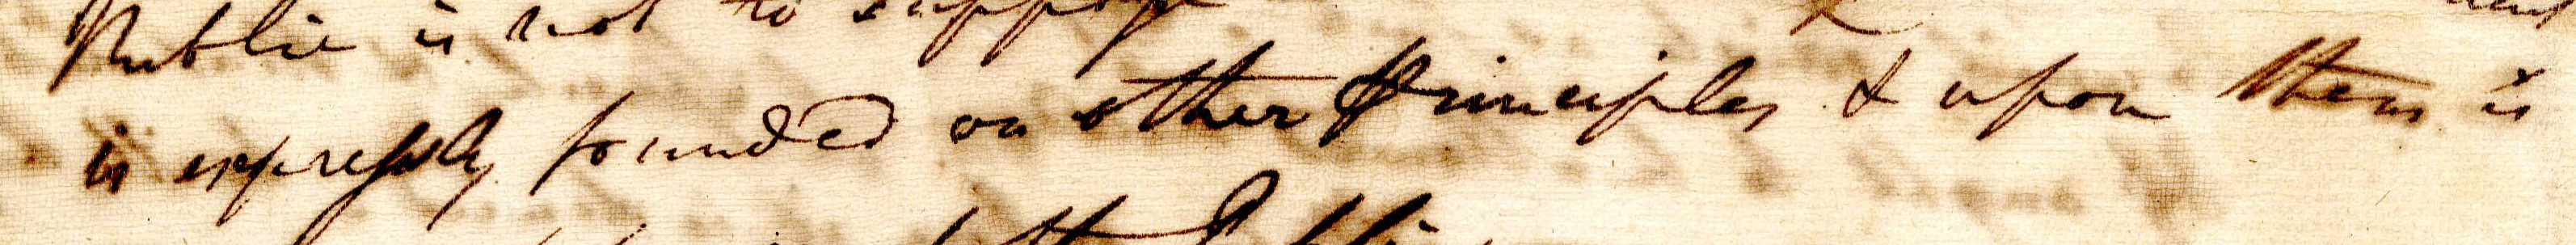is expressly founded on other Principles & upon them is
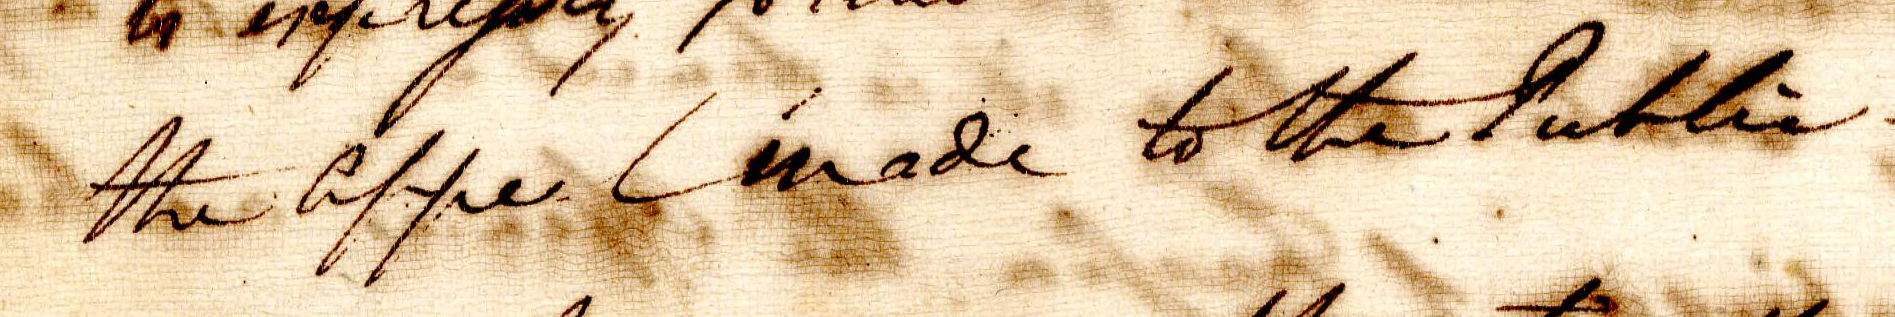the Offer made to the Public-
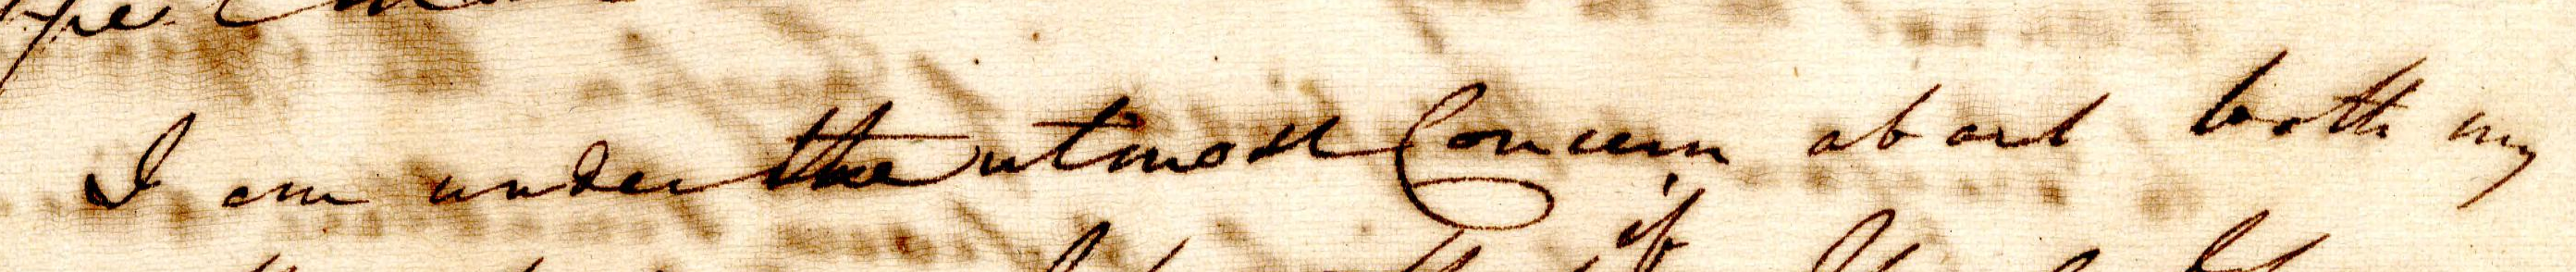I an under the utmost Concern about both my
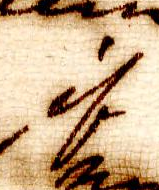if
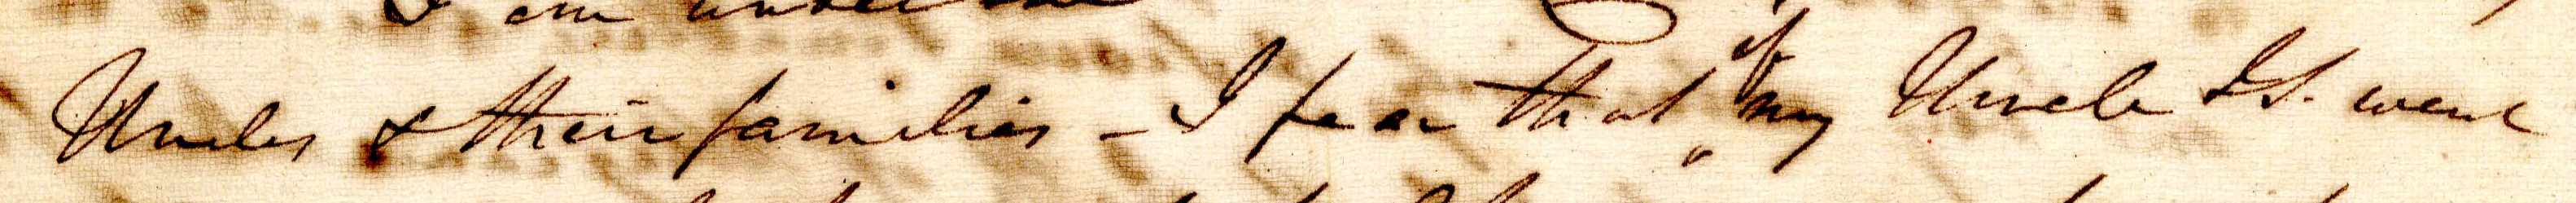Uncles & their families- I fear that ^ my Uncle &c went
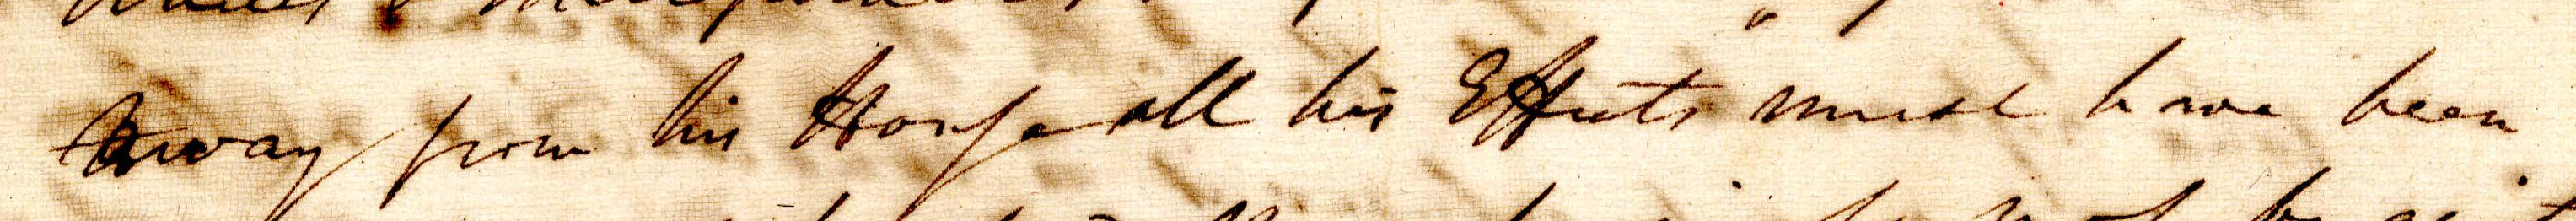away from his House all his Effects must have been
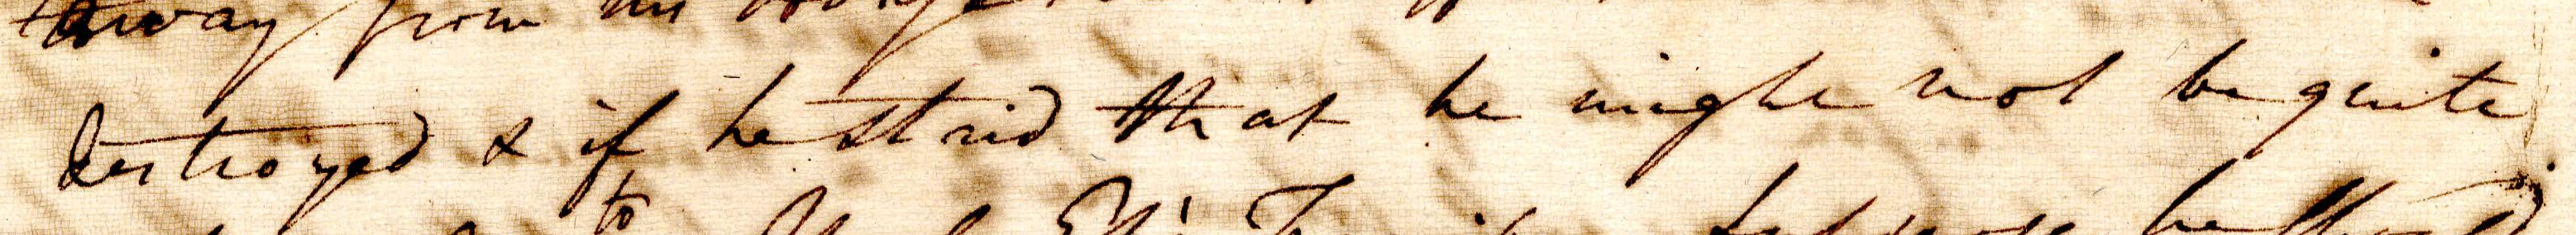destroyed & if he staid that he might not be quite
